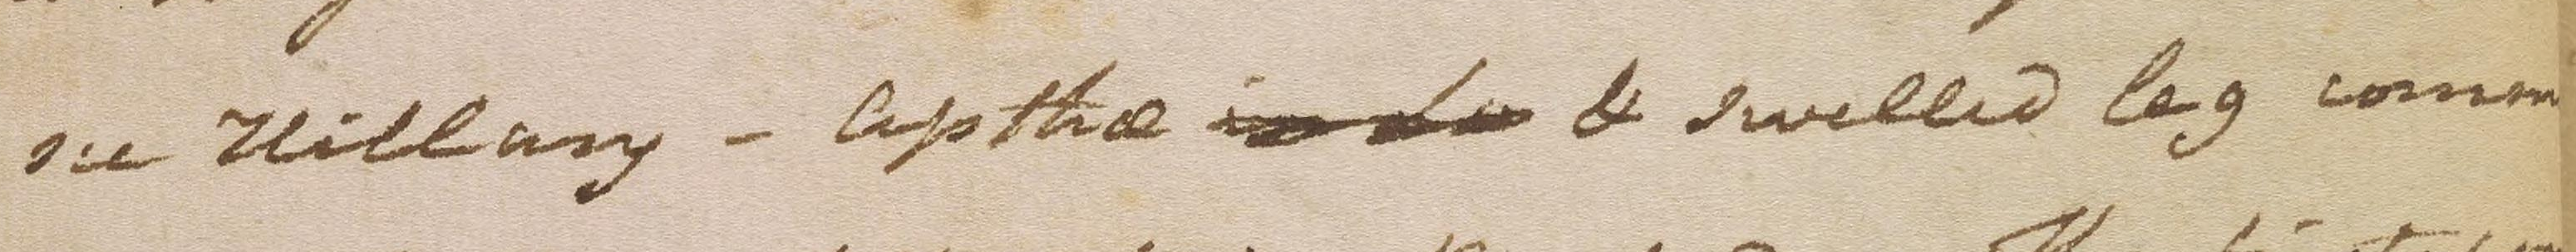see Hillary. Capthae [in Lo-] & swelled leg common
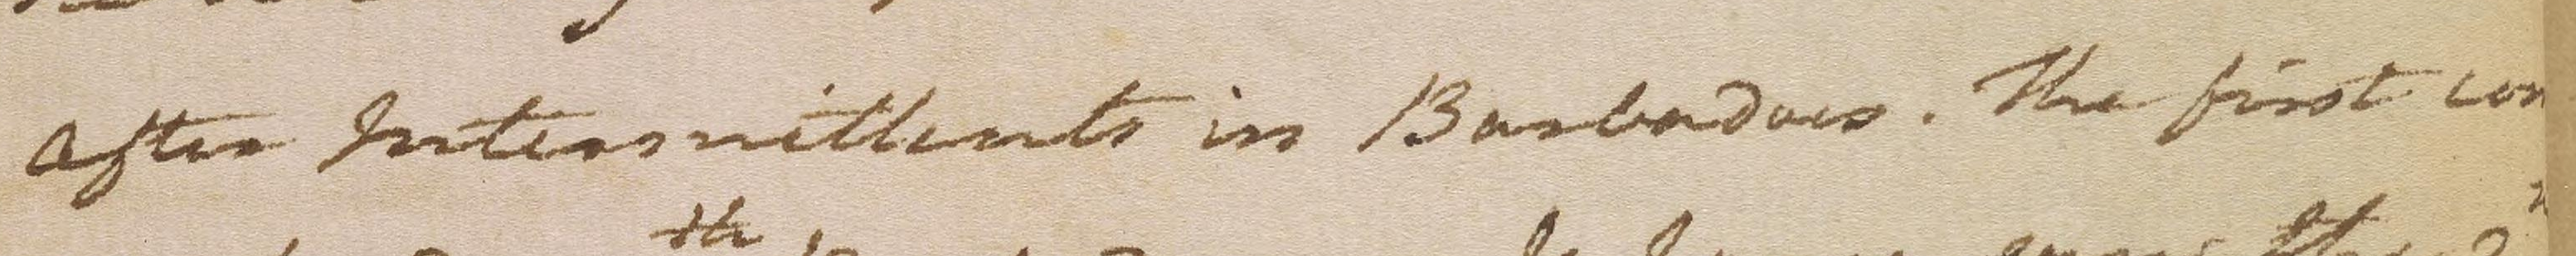after Intermittents in Barbados. The first con
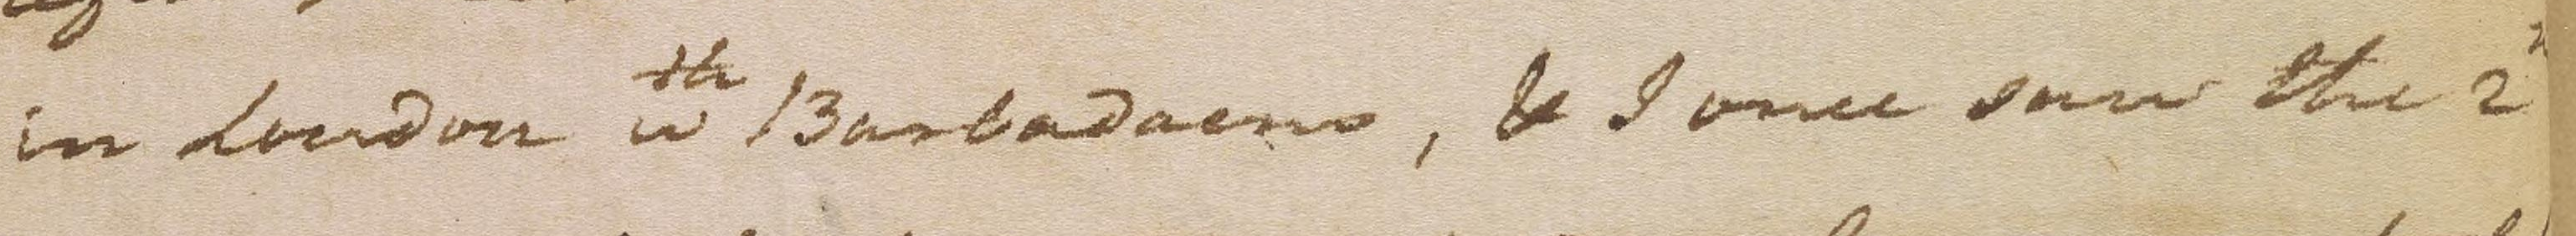in London w^th Barbadaens, & I once saw the 2
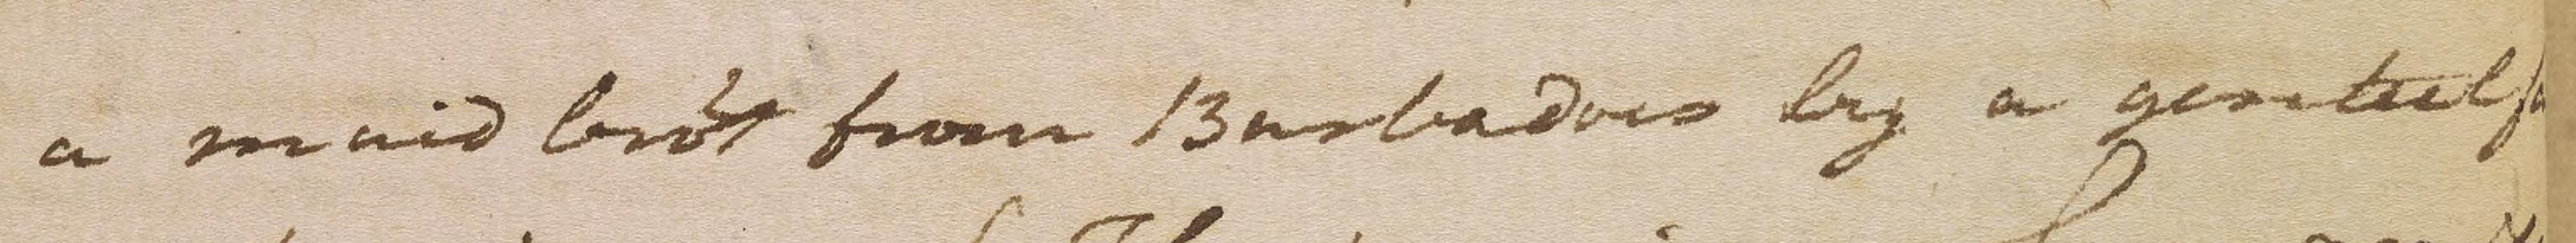a maid bro't from Barbadoes by a genteel
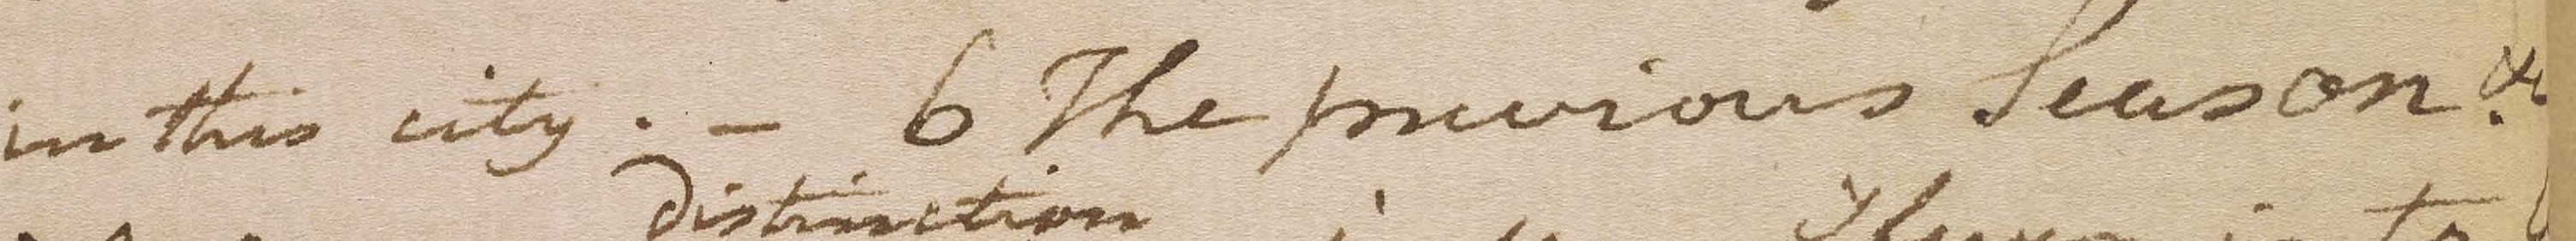in this city.- 6 The previous Season &
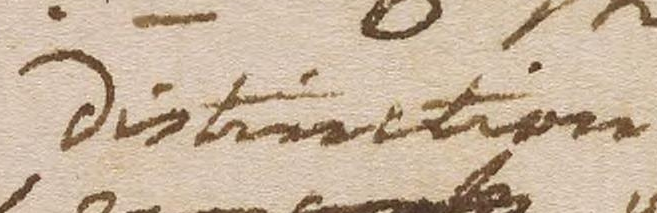distinction
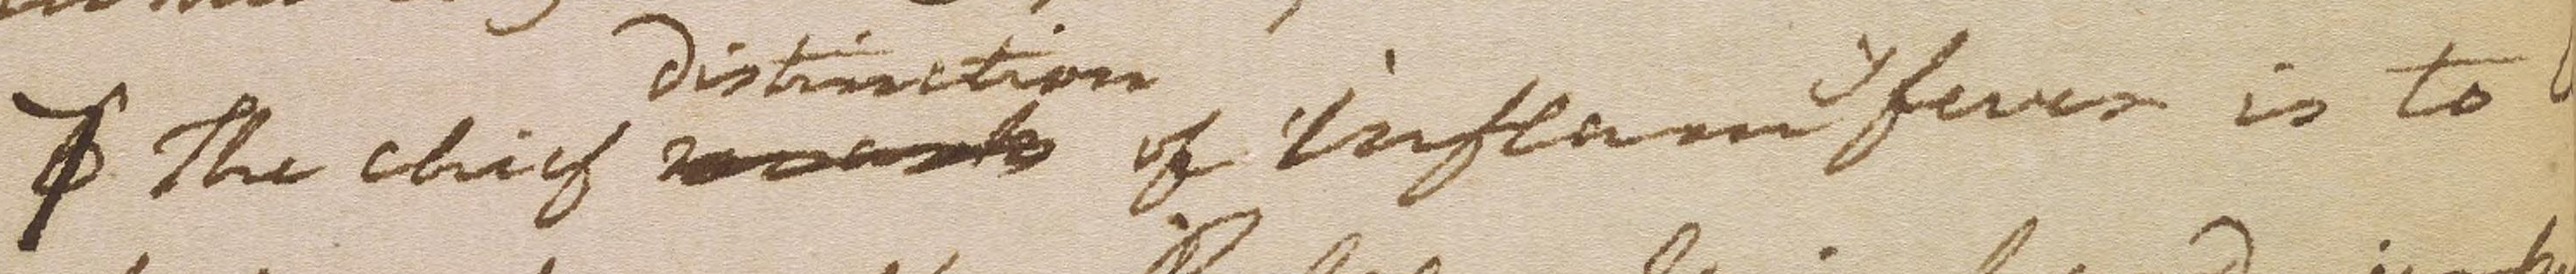7 The chief [remark] of inflam^y fever is to
